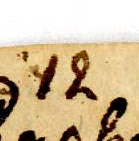12
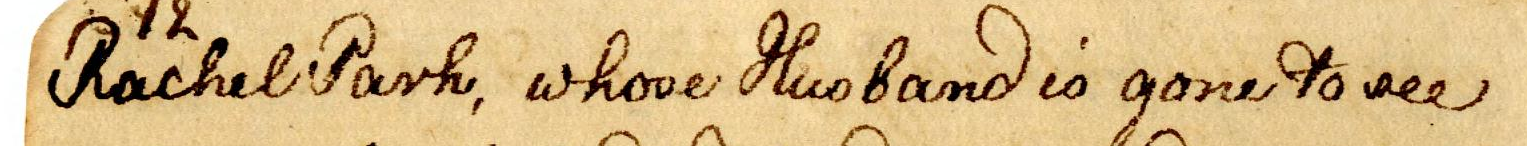Rachel Park, whose Husband is gone to see
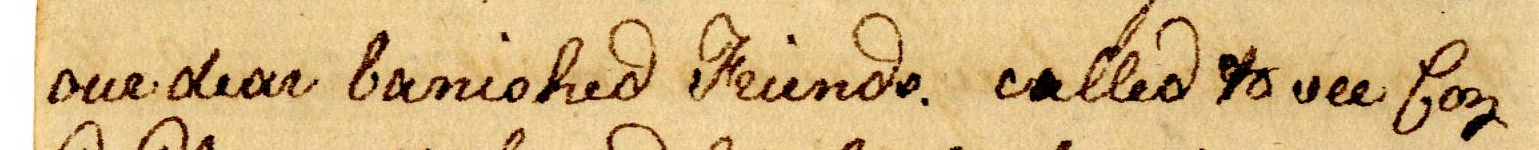our dear banished Friends. called to see Coz
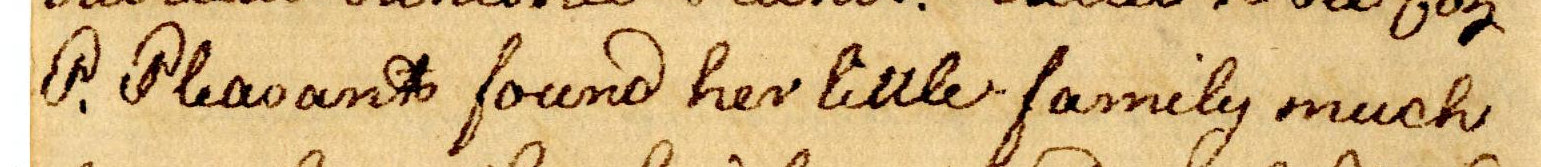P. Pleasants found her little family much
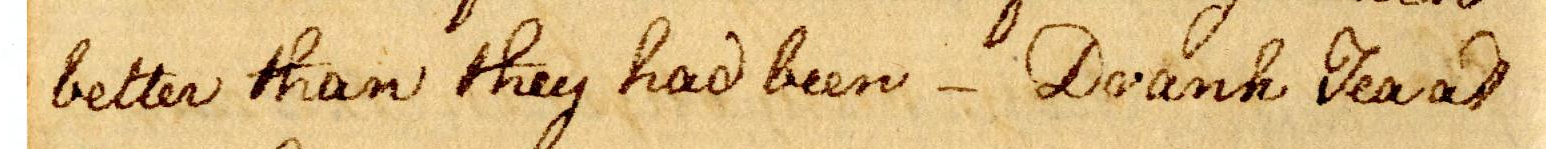better than they had been- Drank Tea at
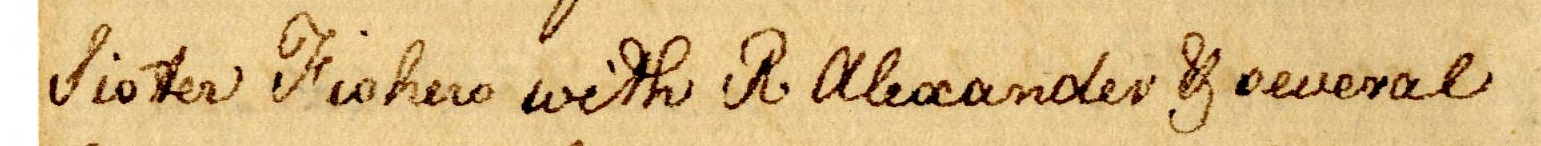Sister Fishers with R Alexander & several
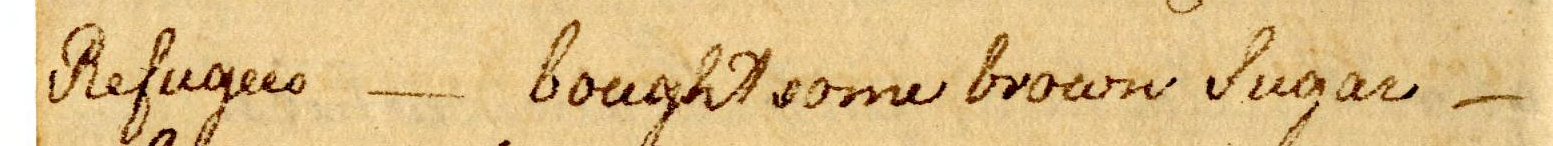Refugees- bought some brown Sugar-
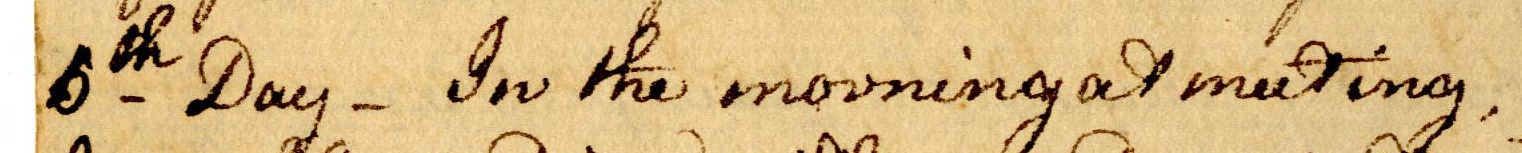5^th Day- In the morning at meeting,
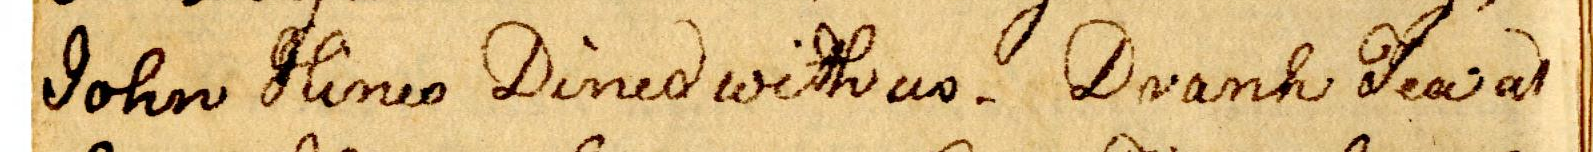John Hines Dined with us- Drank Tea at
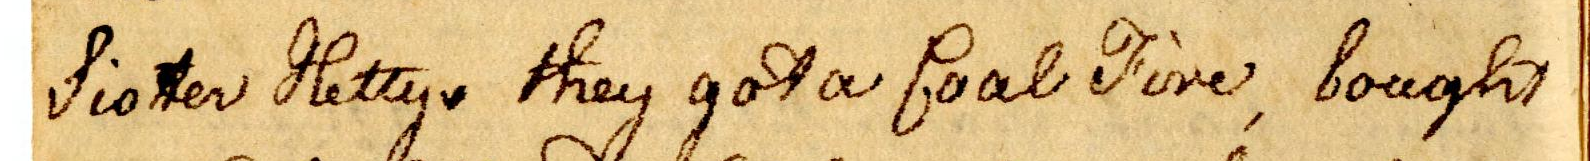Sister Hettys they got a Coal Fire, bought
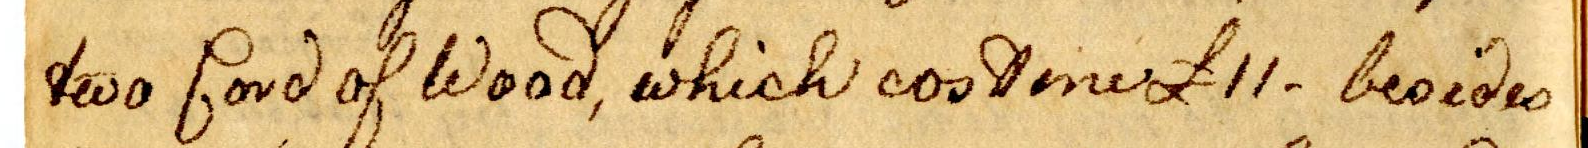two Cord of Wood, which cost me [_]11- besides
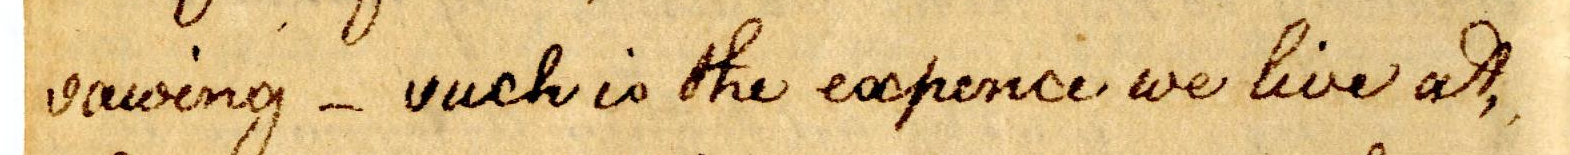sawing- such is the expence we live at,
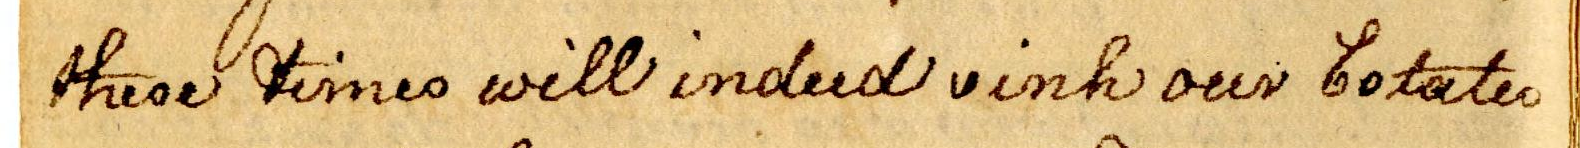these times will indeed sink our Estates
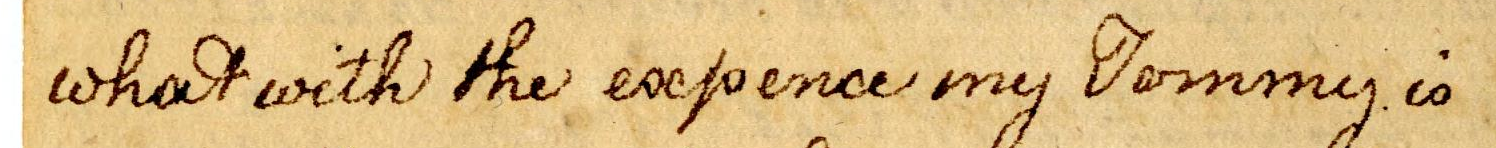what with the expence my Tommy is
